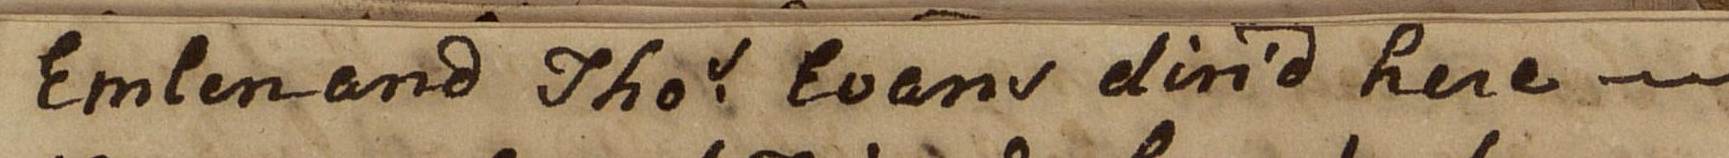Emlen and Tho^s Evans din'd here-
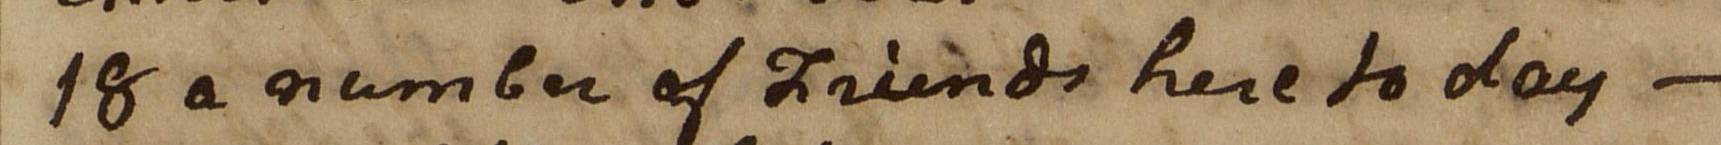18 a number of Friends here to day-
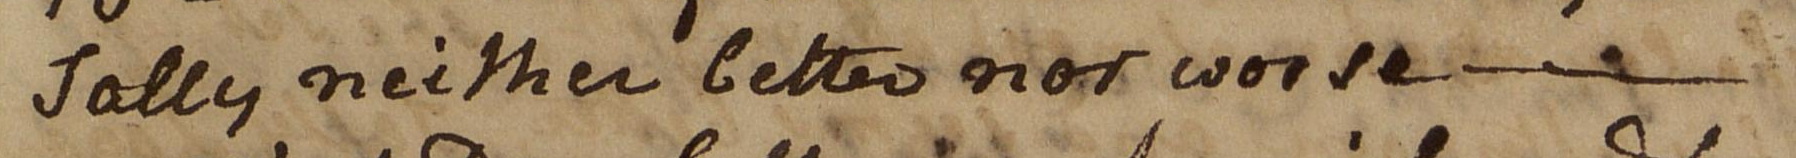Sally neither better nor worse-
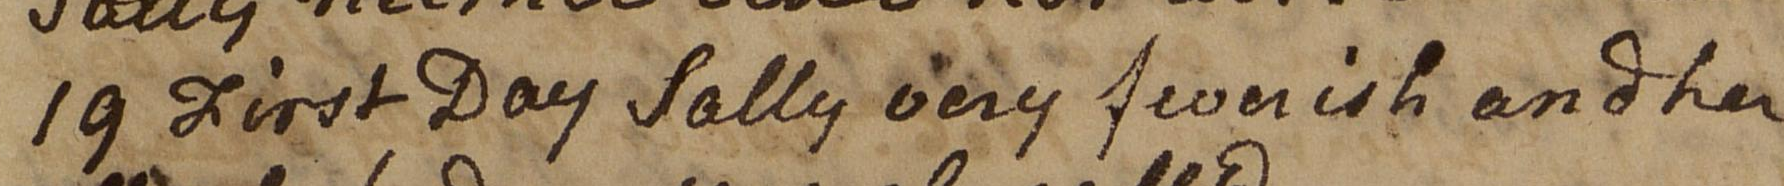19 First Day Sally very feverish and her
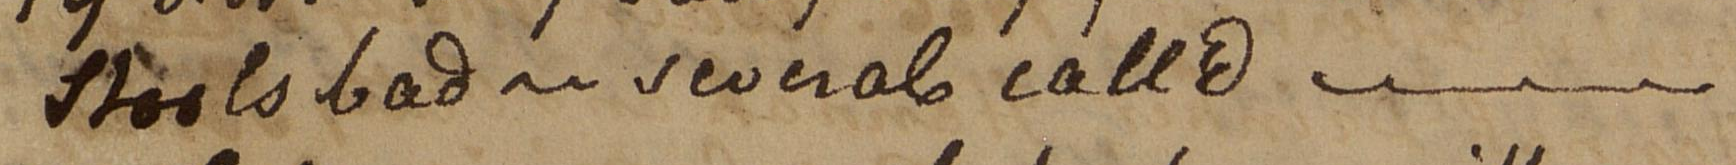Stools bad- several call'd-
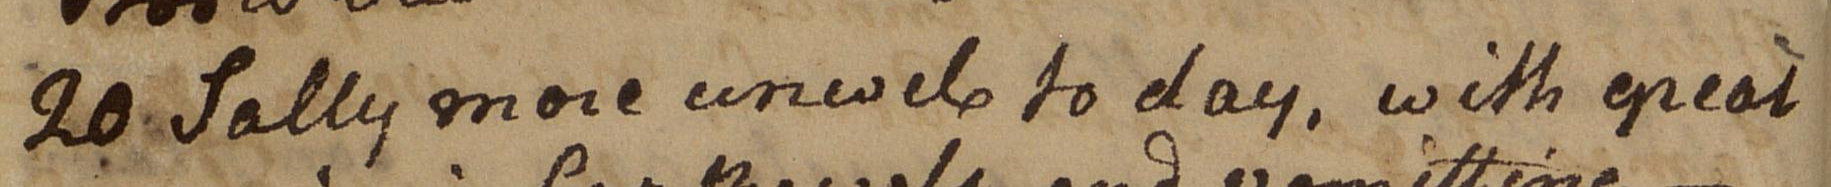20 Sally more unwel to day, with great
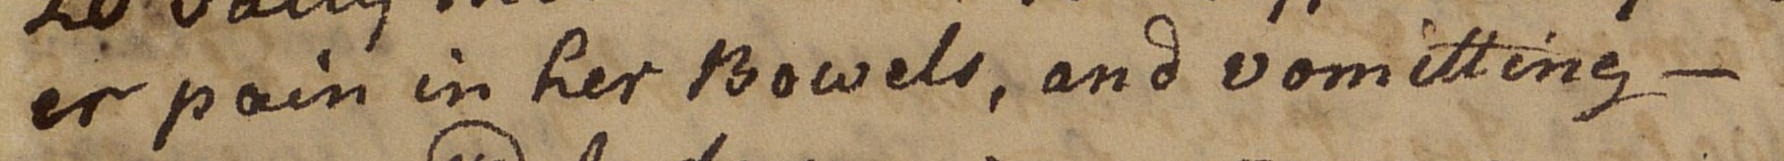er pain in her Bowels, and vomitting-
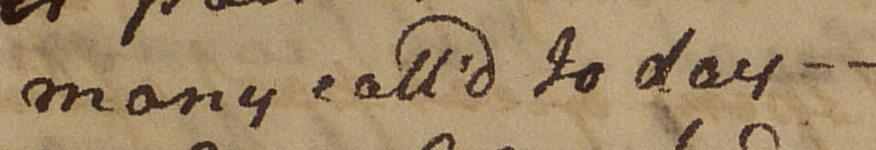many call'd to day-
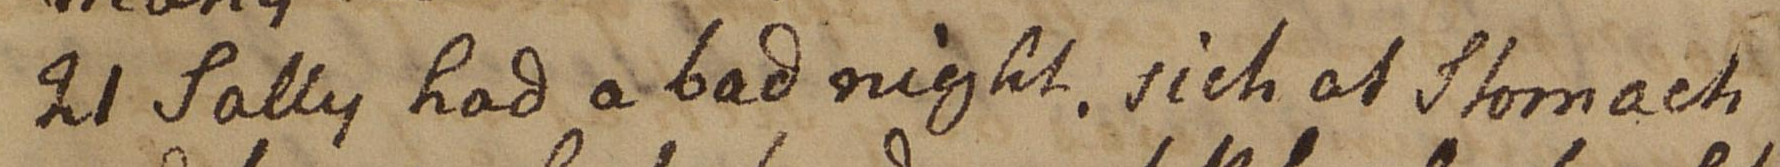21 Sally had a bad night, sick at Stomach
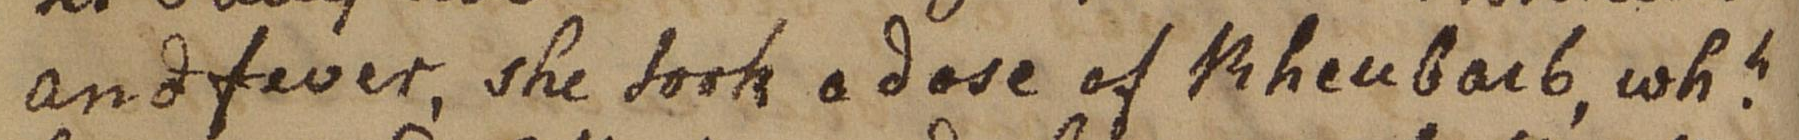and fever, she sook a dose of Rheubarb, wh^h.
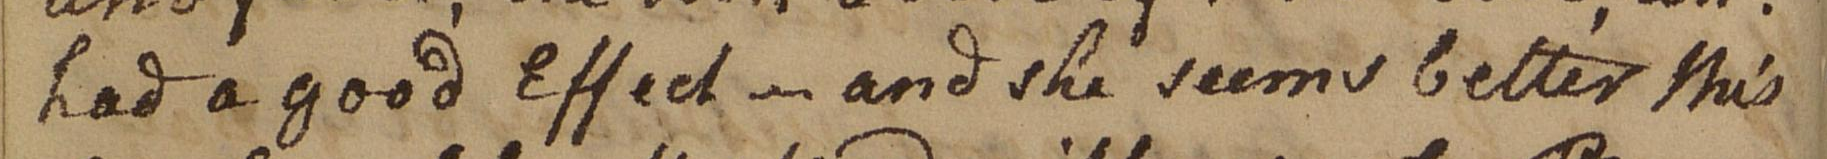had a good Effect- and she seems better this
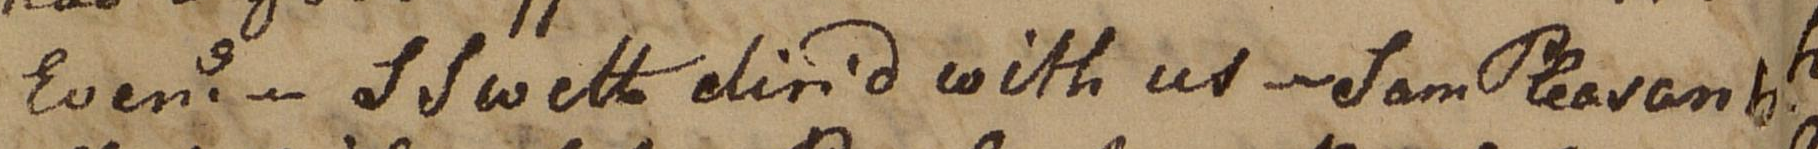Even.^g- S Swett din'd with us- Sam Pleasants
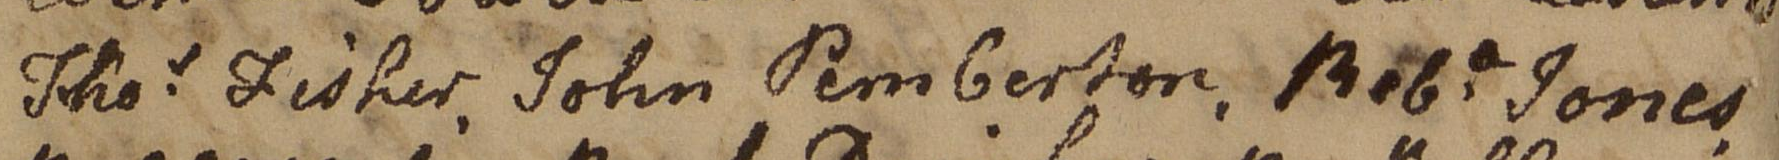Tho^s. Fisher, John Pemberton, Reb^a. Jones,
